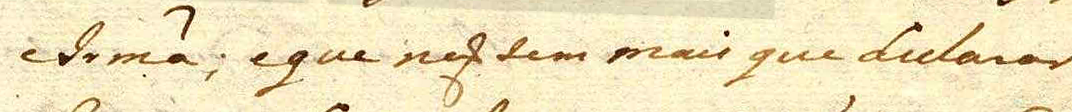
e Irmã; e que naõ tem mais que declarar
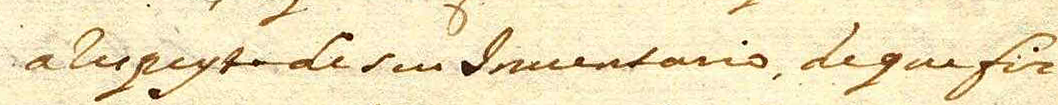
a Respeyto de seu Inuentario, de que fiz
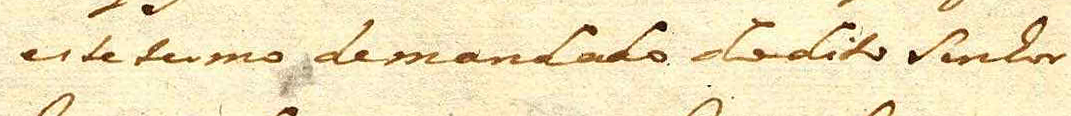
este termo de mandado do dito Senhor
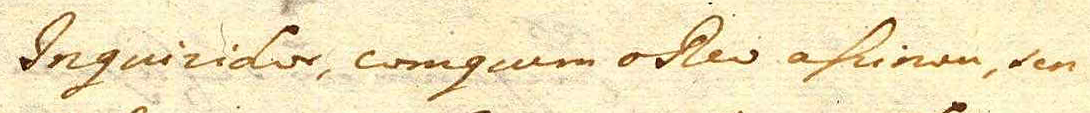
Inquizidor, com quem o Reo assinou, sen
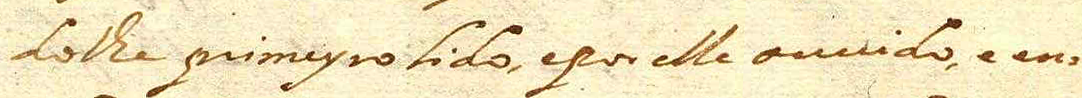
do lhe primeyro lido, e por elle ouuido, e en
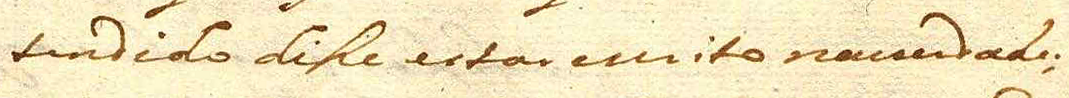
tendido disse estar escrito na uerdade;
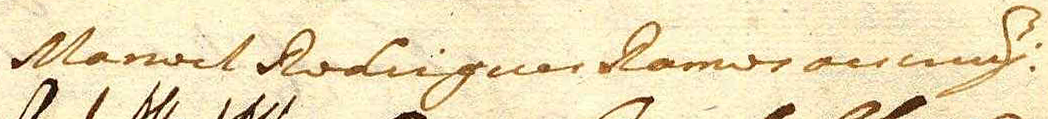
Manoel Rodrigues Ramos o escreuj.
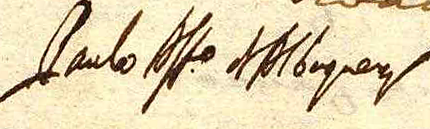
Paulo Aff.o d̄ Albuquerq̄
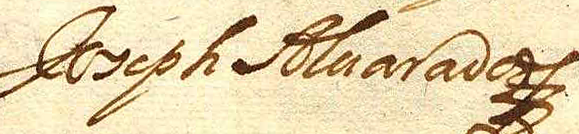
Joseph Aluarado
